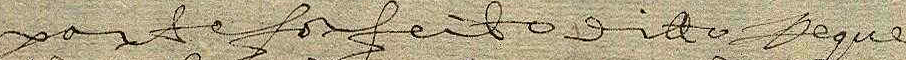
parte for feito ditto reque
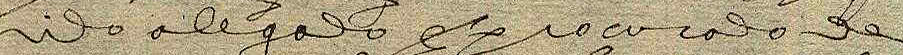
rido alegado e procurado de
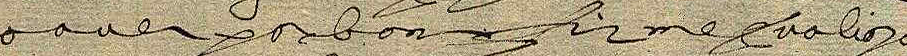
o auer por bom firme e valiozo
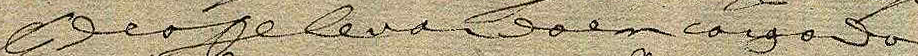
e de o relevar do emcargo da sa
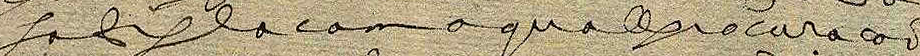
tisfacam a qual procuracaõ
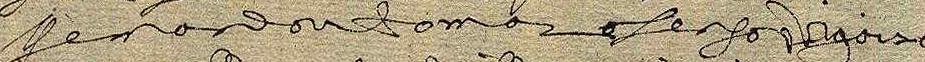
lhe mandou tomar o Senhor Vigairo
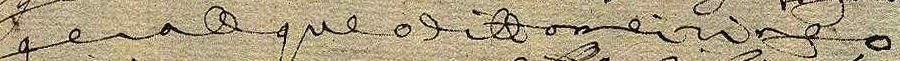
gerall que o ditto meirinho
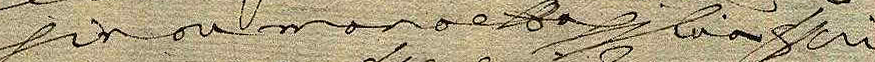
asinou Manoell da Silva escri
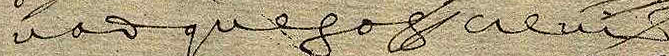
uaõ que ho escrevi
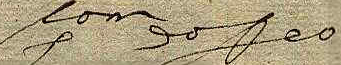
p. cam do Reo
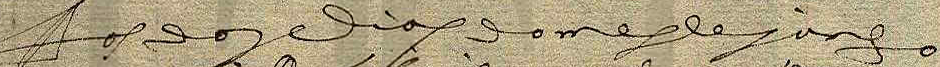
Aos doze dias do mes de junho
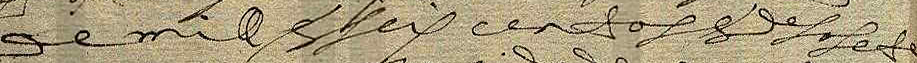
de mill e seiscentos e desasete
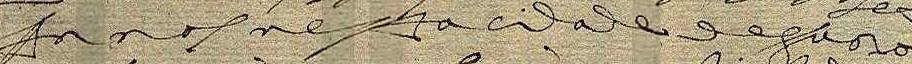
Annos nesta cidade de Evora
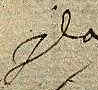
Jca
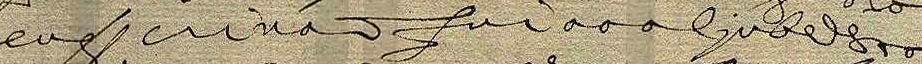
eu escrivaõ fui ao aljube desta
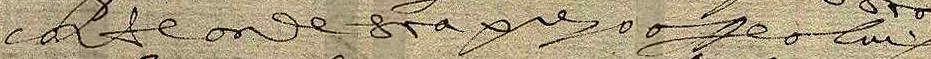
corte onde sta prezo o Reo luis
